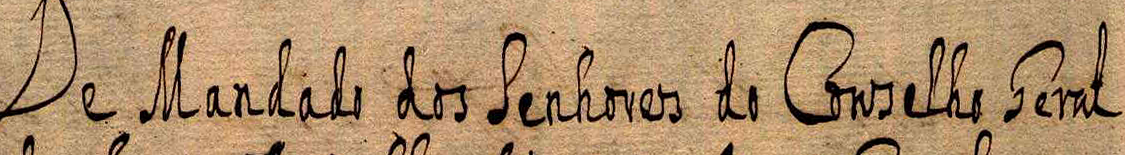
De Mandado dos Senhores do Conselho Geral
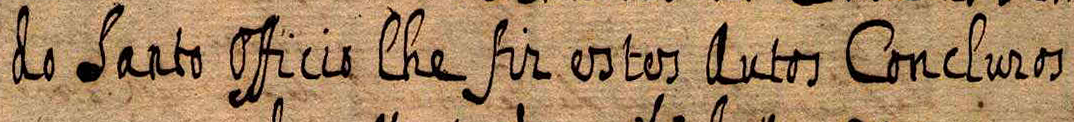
do Santo Officio lhe fiz estes autos Concluzos,
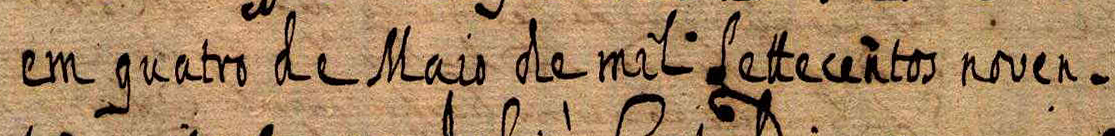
em quatro de Maio de miL settecentos noven
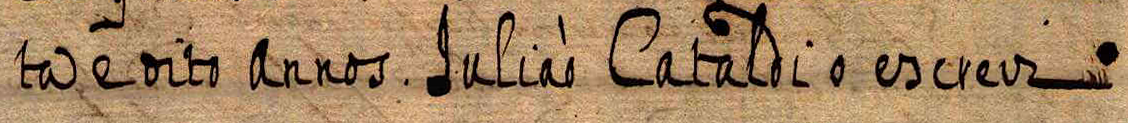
ta e oito annos. Iuliaõ Cataldi o escrevi
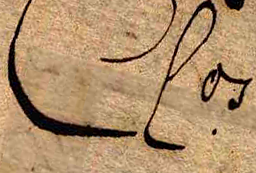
CL.os
